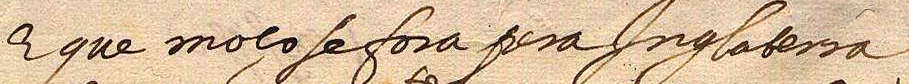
E que moço se fora pera Jnglaterra
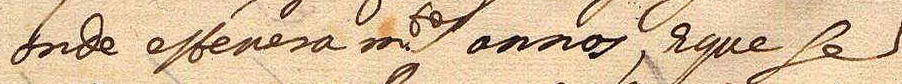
onde esteuera m.tos annos, E que se
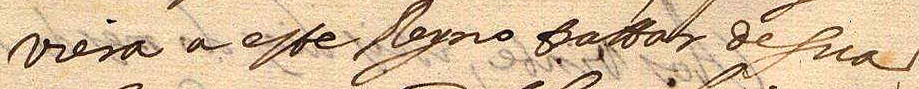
viera a este Reyno trattar de sua
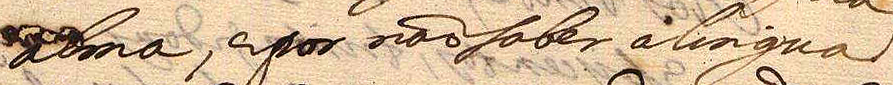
alma, E por não saber a lingua
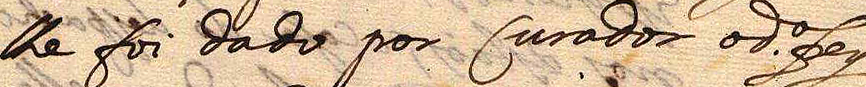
lhe foi dado por Curador o d.o frey
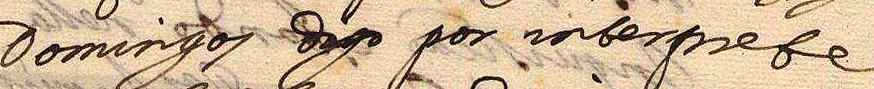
Domingos digo por interprete
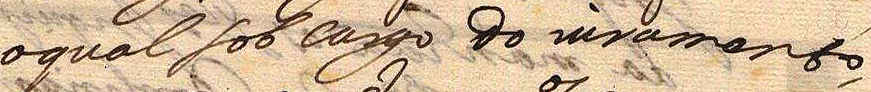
o qual sob cargo do iuramento,
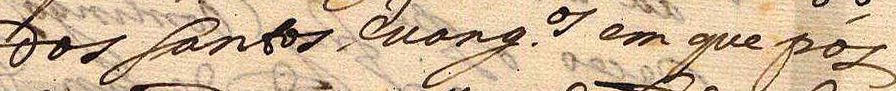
dos Santos Euang.os em que pos
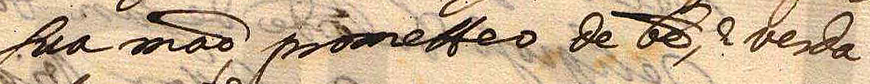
sua mão prometteo de b̄e, E verda
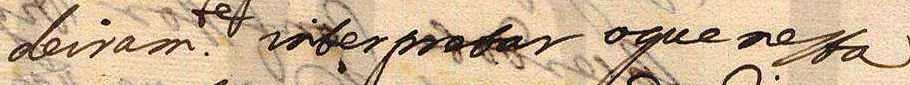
deiram.te interpretar o que nesta
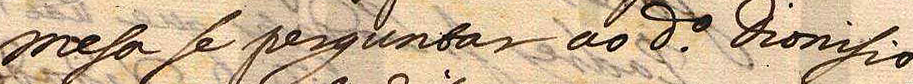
mesa se perguntar ao d.o Dionisio,
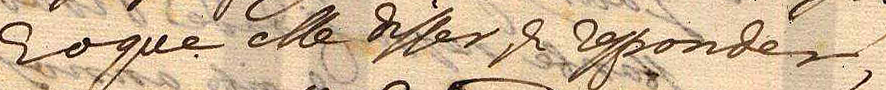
E o que elle disser, E responder,
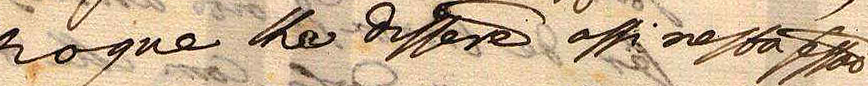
E o que lhe dis̄sere assi nesta sessão
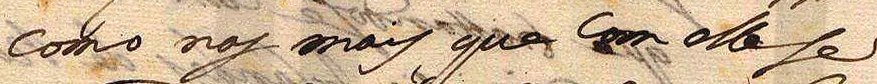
como nas mais que com elle se
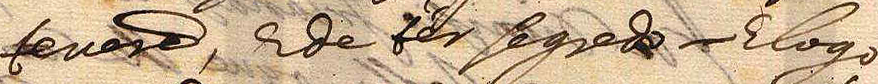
teuer̄e, E de ter segredo — E logo
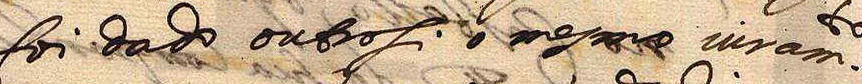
foi dado outrosi o mesmo iuramto.
